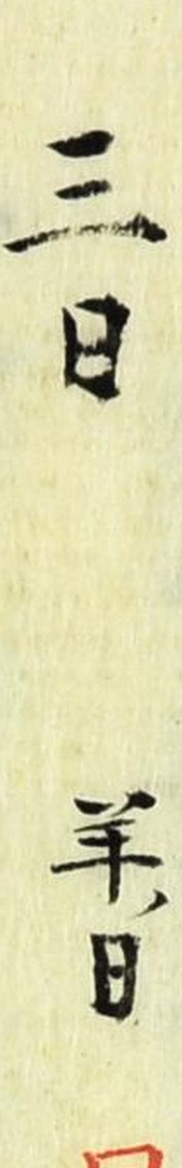三日羊日同
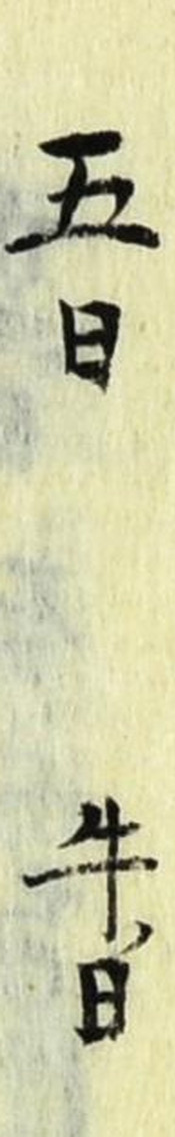五日牛日
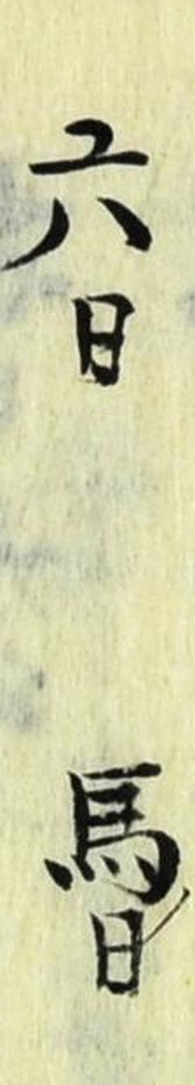六日馬日
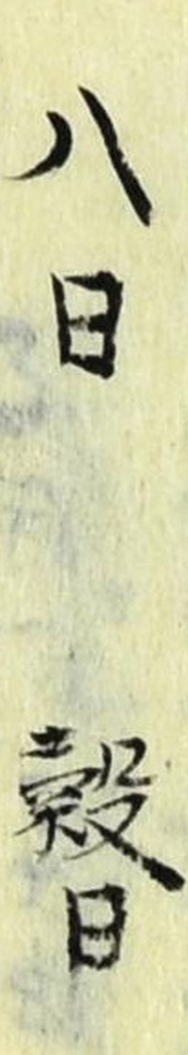八日穀日
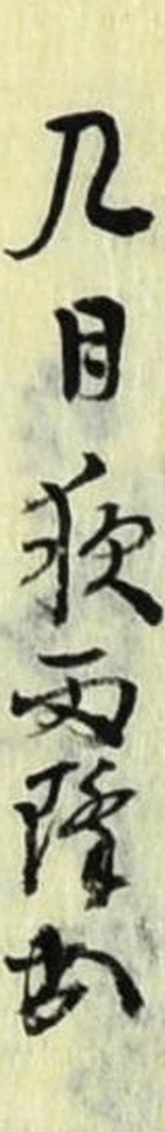九日夜雨降出
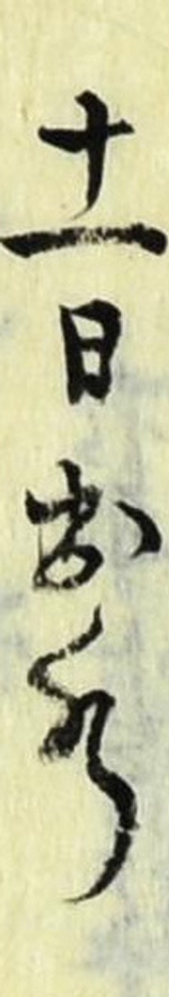十一日出水
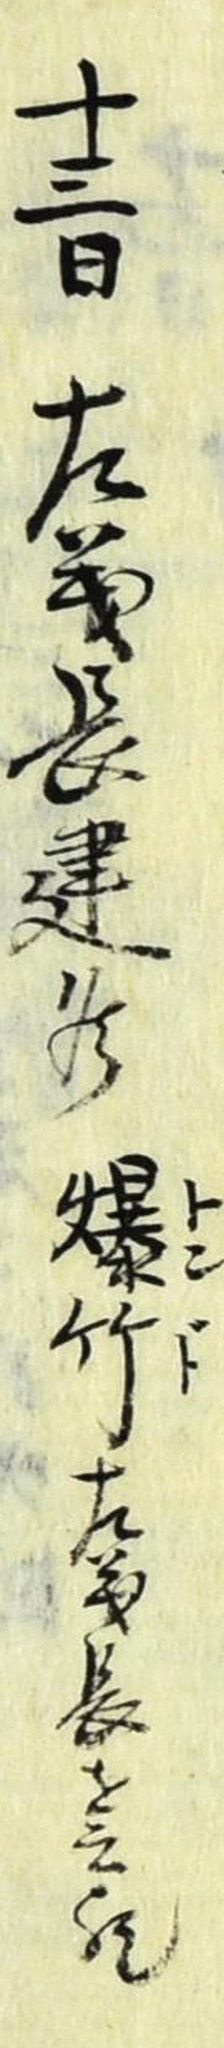十三日左義長建候爆竹左義長を云歟
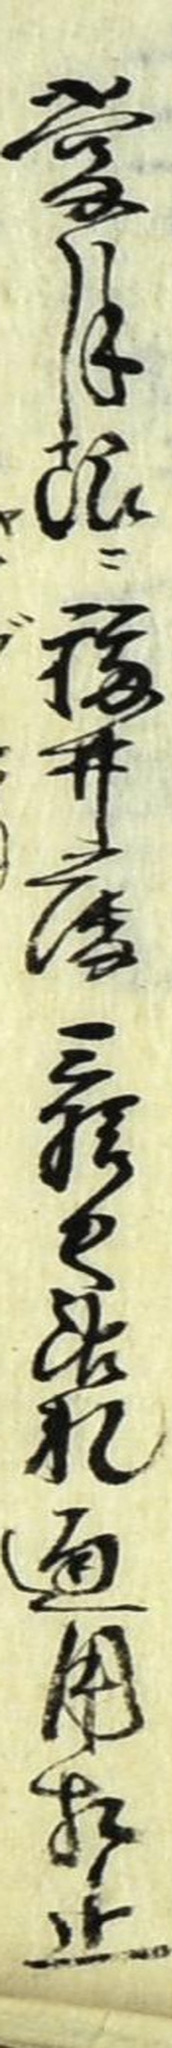当月限ニ福井藩三拾匁銀札通用相止

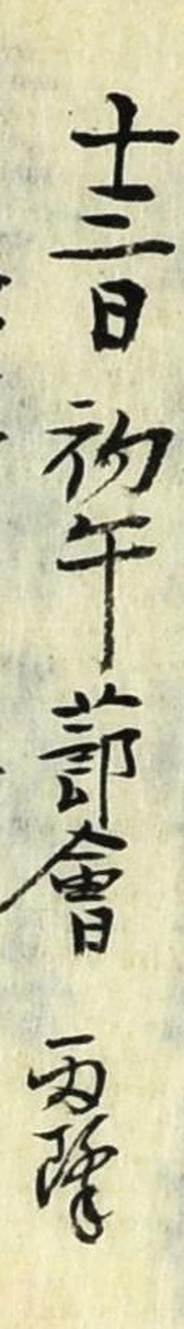十三日初午節会雨降
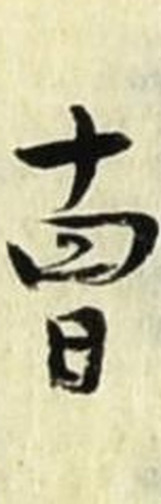十四日
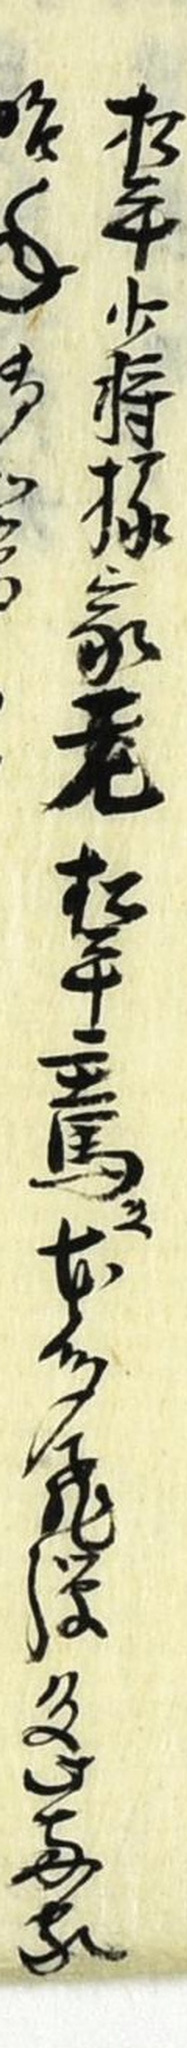松平少将様家老松平主馬殿本多飛騨殿此両家
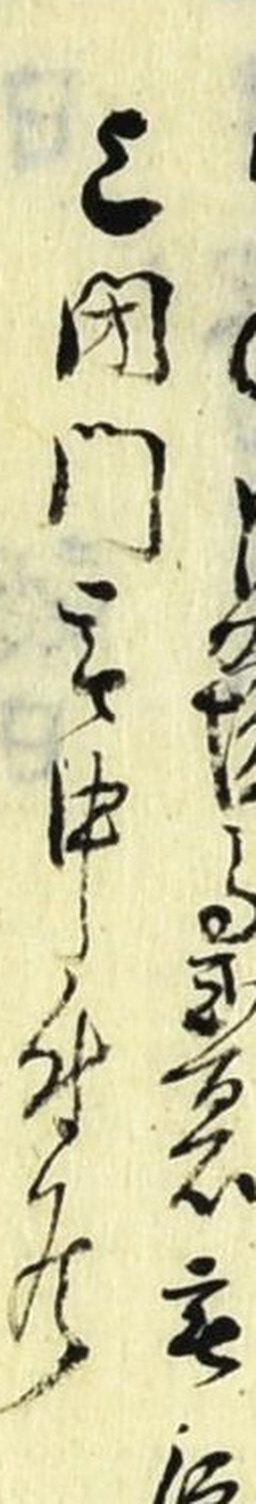上閉門被申付候
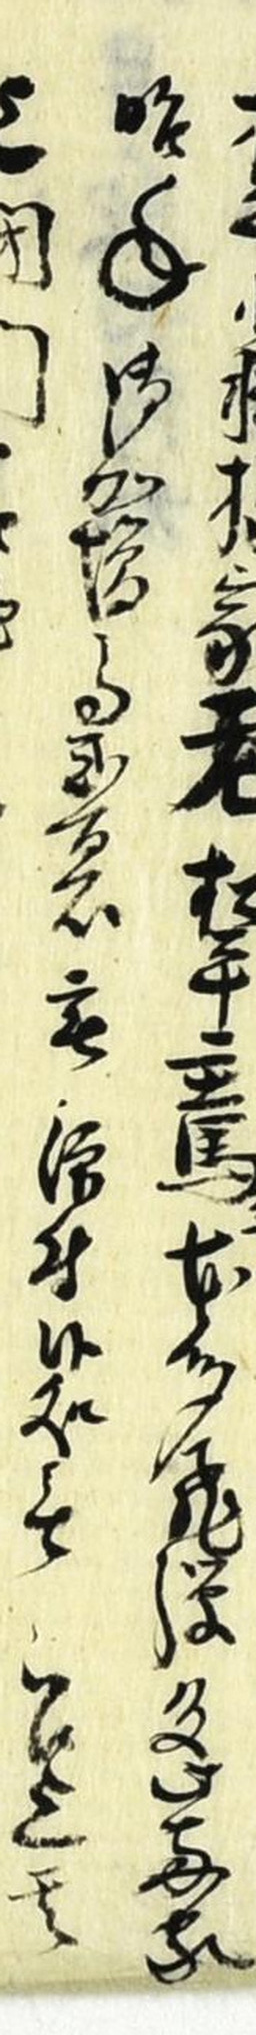昨年御加増高弐百石被仰付候処被召上其
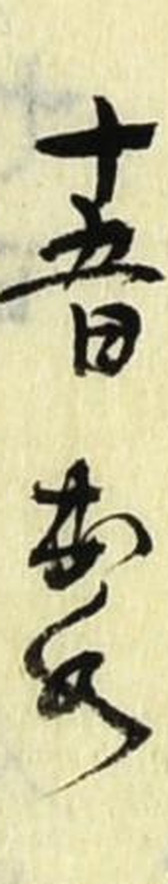十五日出水
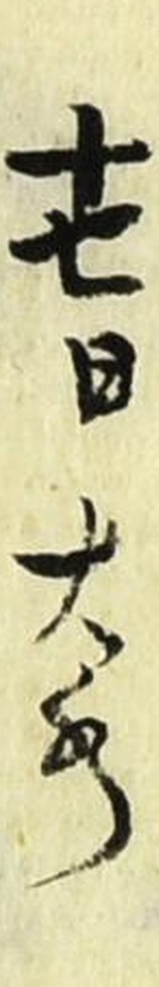十七日大水
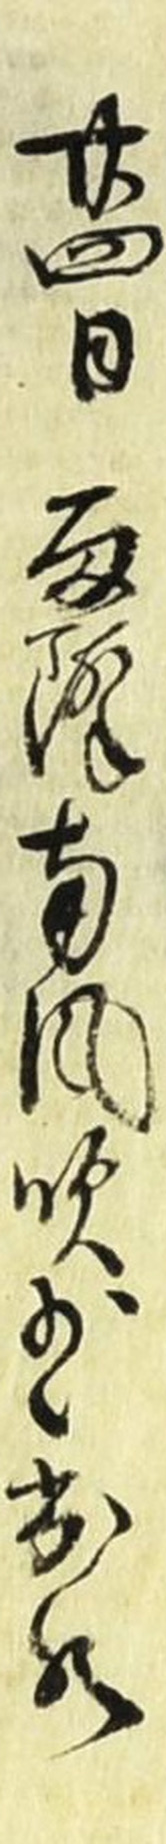廿四日雨降南風風吹少々出水
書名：（日記）
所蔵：福井県文書館 Fukui Prefectural Archives
